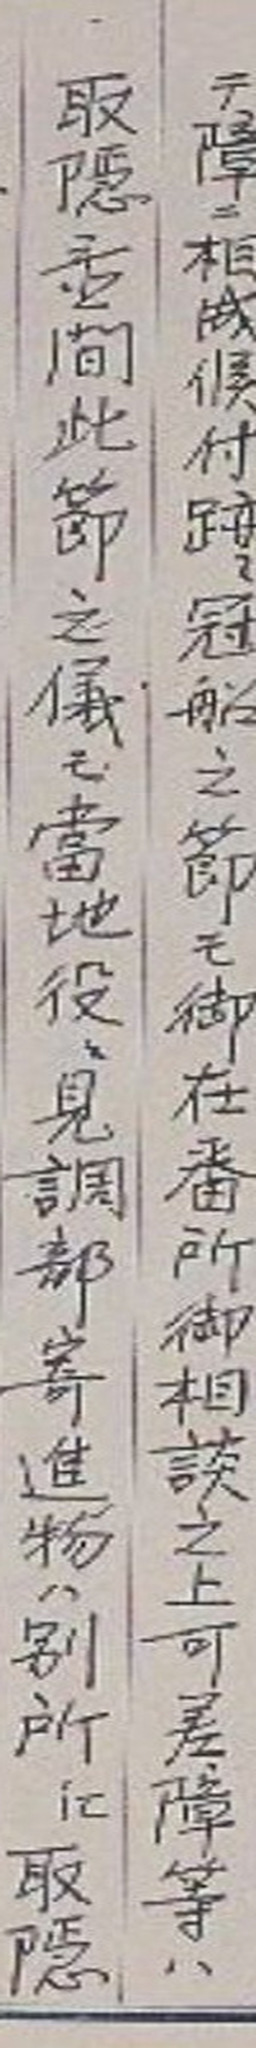取隠置間此節之儀も当地役々見調部寄進物は別所え取隠
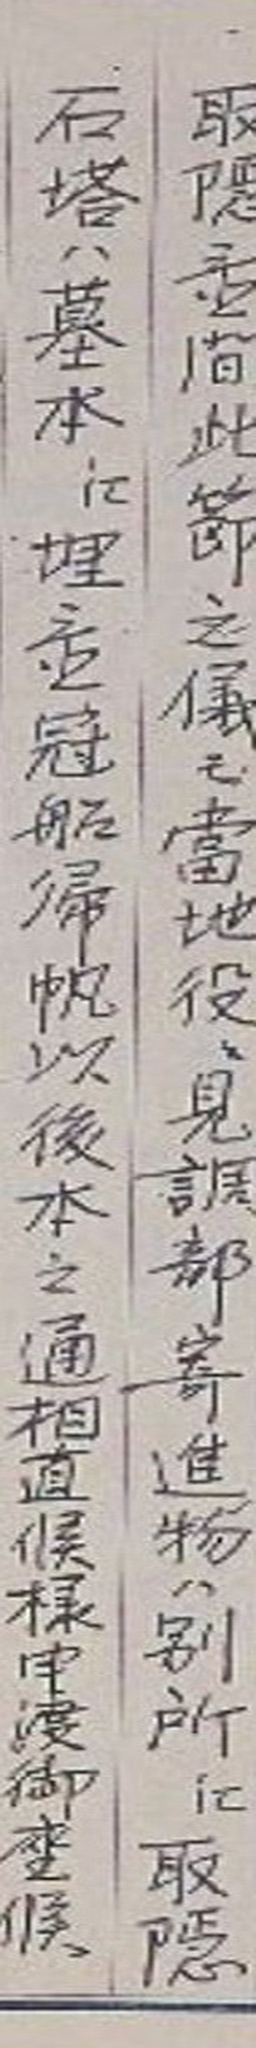石塔は墓本え埋置冠船帰帆以後本之通相直候様申渡御座候
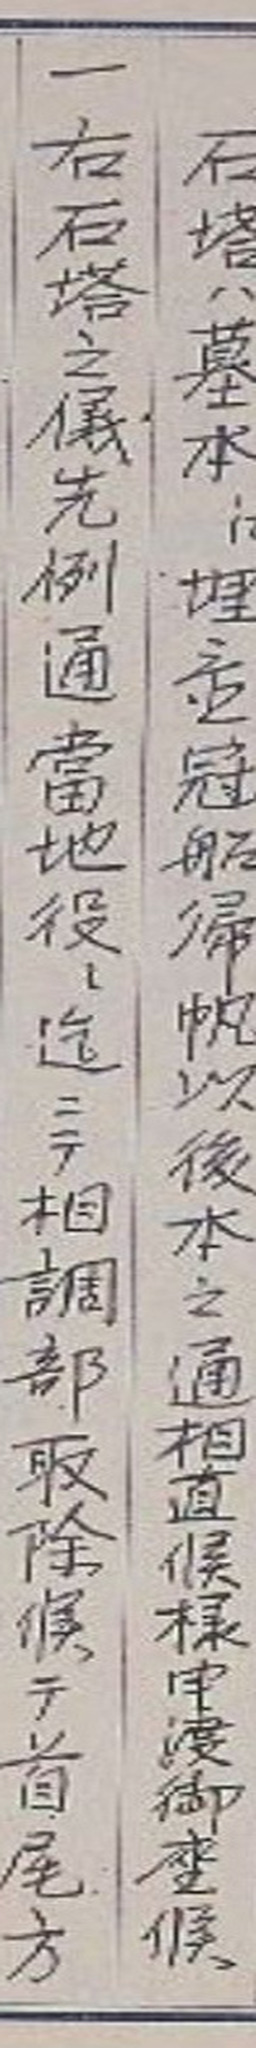一右石塔之儀先例通当地役々迄にて相調部取除候て首尾方
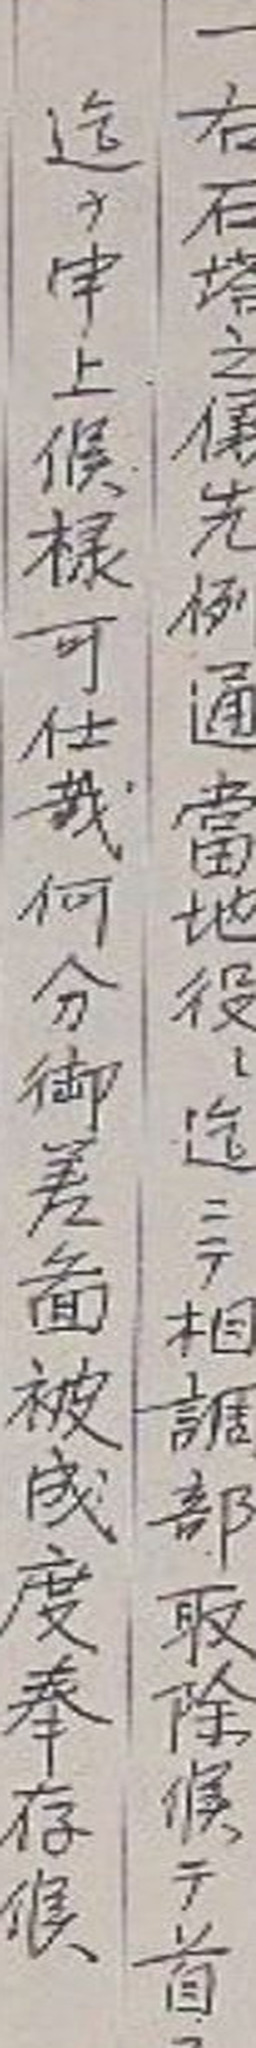迄を申上候様可仕哉何分御差図被成度奉存候
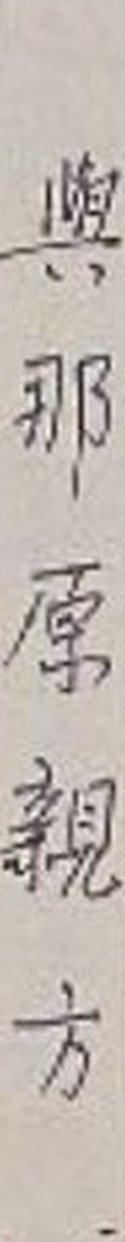与那原親方
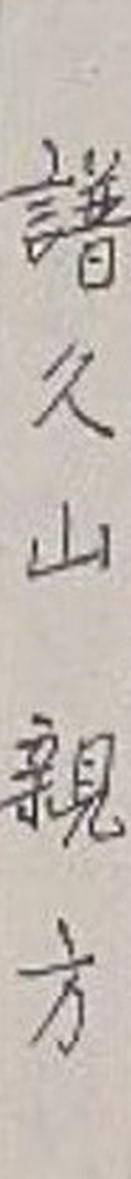譜久山親方
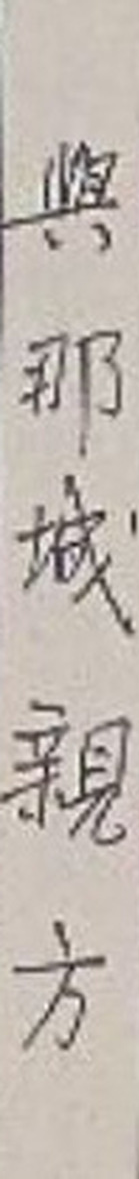与那城親方
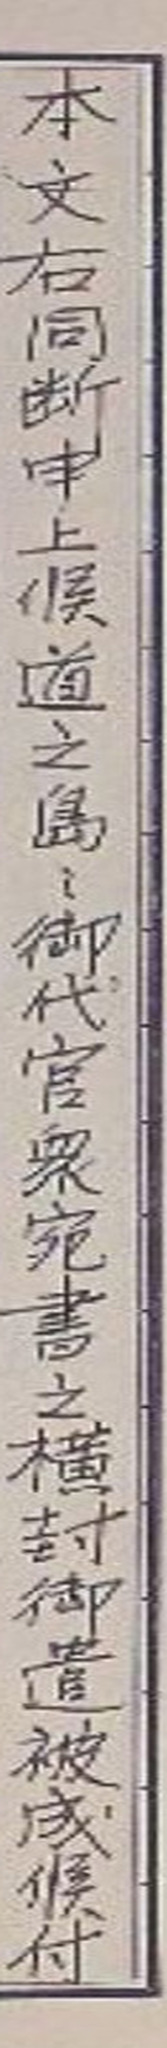本文右同断申上候道之島の御代官衆宛書之横封御遣被成候付
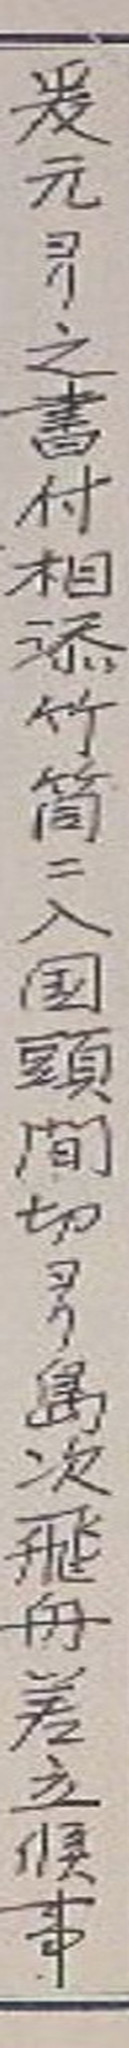爰元より之書付相添竹筒に入国頭間切より島次飛舟差立候事
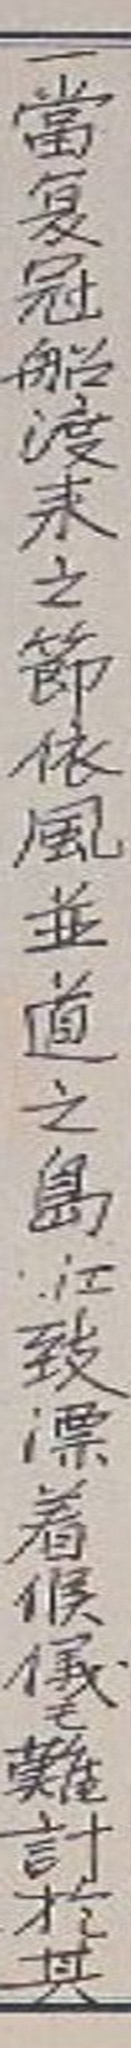一当夏冠船渡来之節依風並道之島え致漂着候儀も難計於其
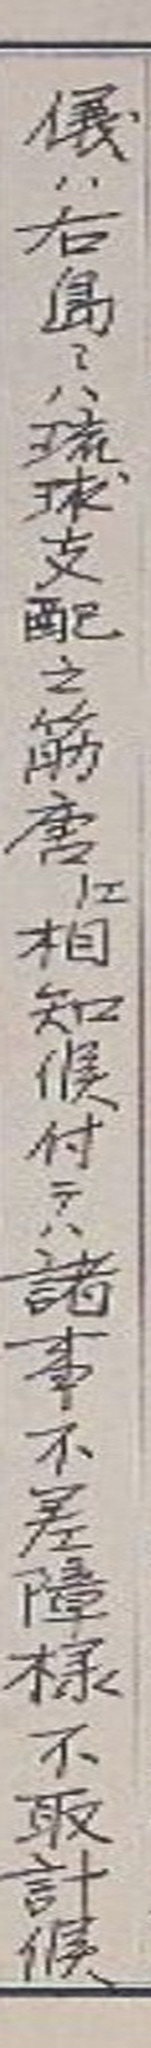儀は右島々は琉球支配之筋唐え相知候付ては諸事不差障様不取計候
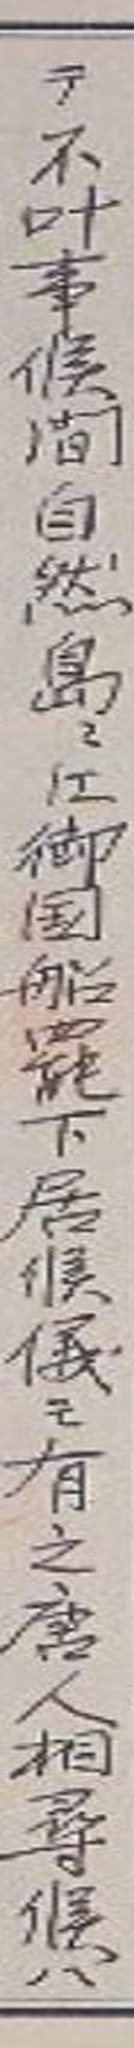て不叶事候間自然島々え御国船罷下居候儀も有之唐人相尋候は
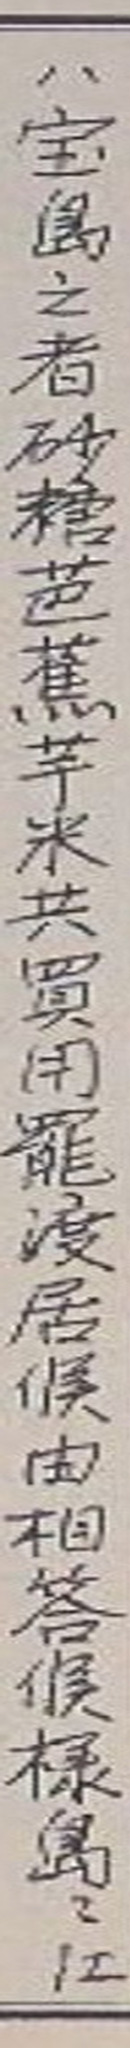は宝島之者砂糖芭蕉芋米共買用罷渡居候由相答候様島々え
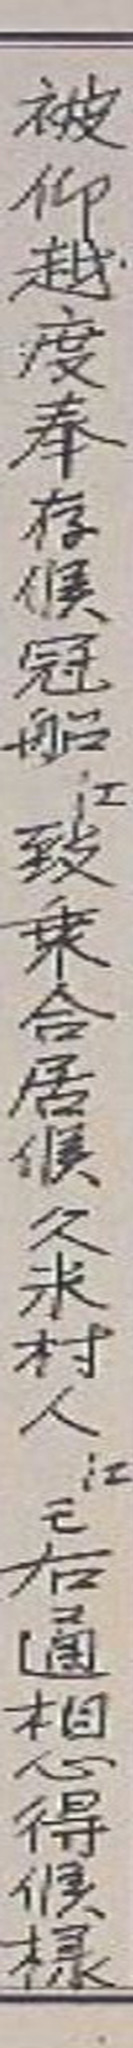被仰越度奉存候冠船え致乗合居候久米村人えも右通相心得候様
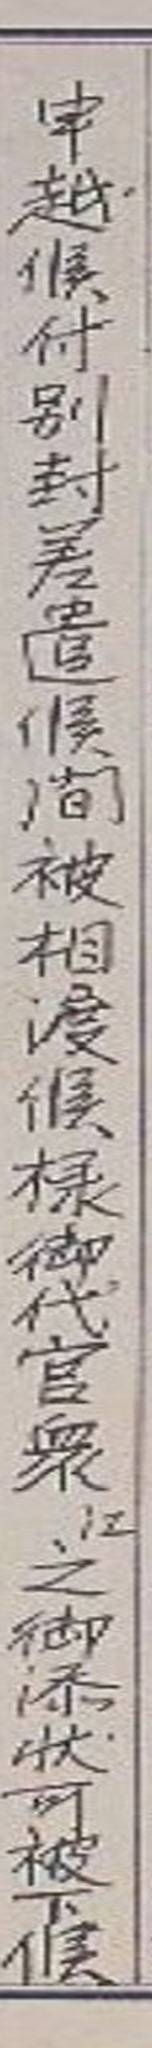申越候付別封差遣候間被相渡候様御代官衆え之御添状可被下候
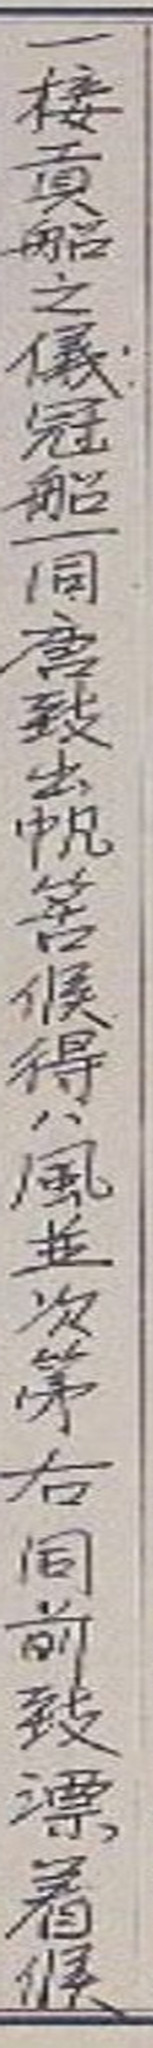一接貢船之儀冠船一同唐致出帆筈候得は風並次第右同前致漂着候
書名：支那冊封使来琉諸記 下巻
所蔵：University of the Ryukyus Library
